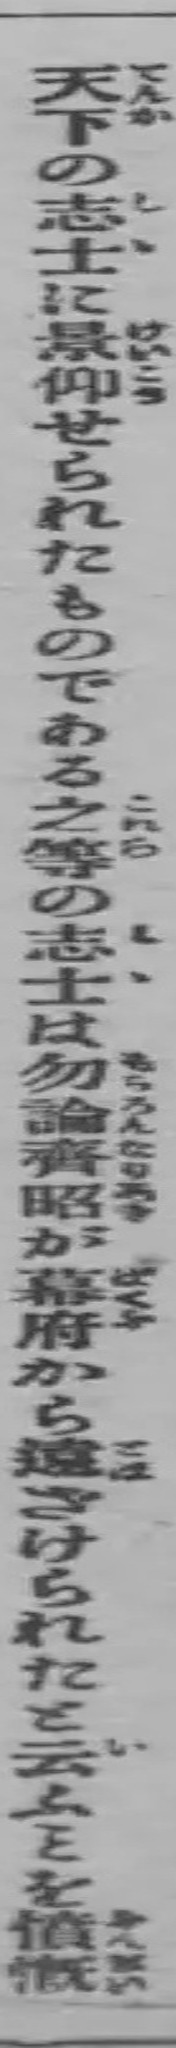天下の志士に景迎せられたものである之等の志士は勿論斉昭が幕府から遠ざけられたと云ふことを憤慨
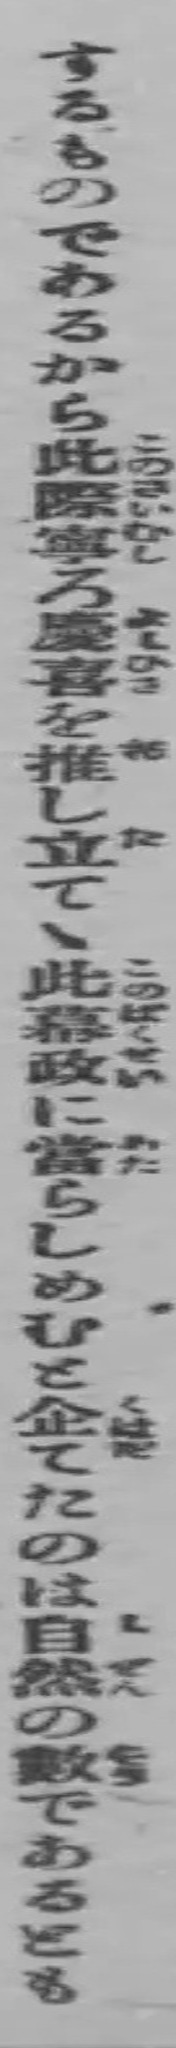するものであるから此際寧ろ慶喜を推し立てゝ此幕政に当らしめむと企てたのは自然の数であるとも
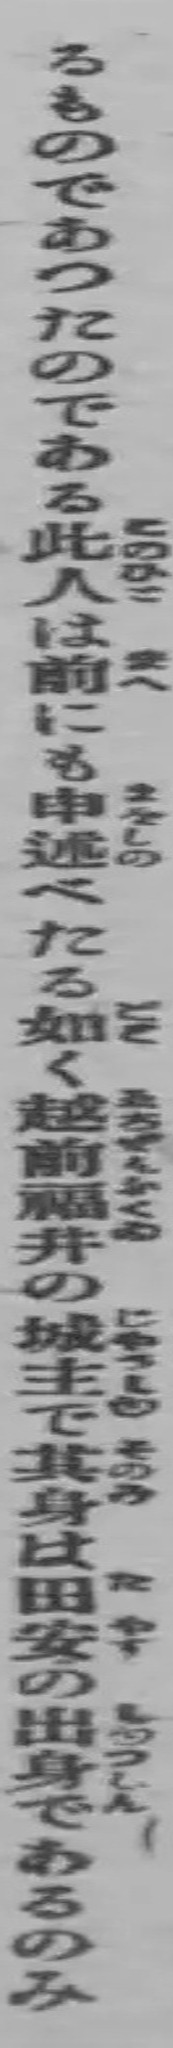るものであつたのである此人は前にも申述べたる如く越前福井の城主で其身は田安の出身であるのみ
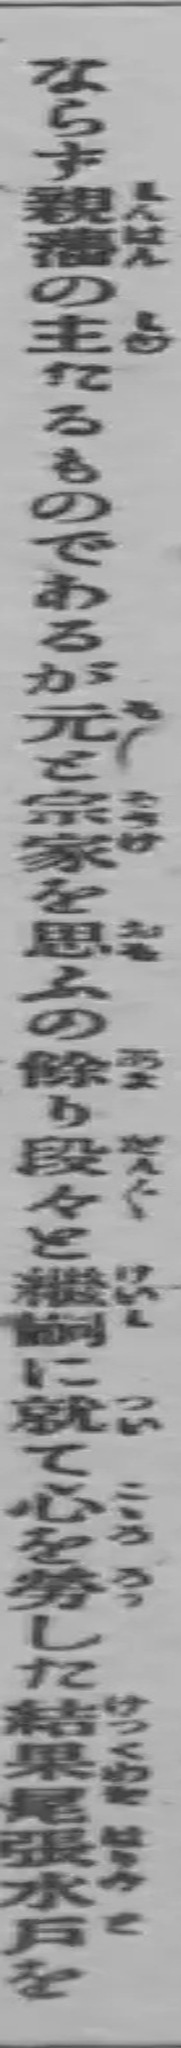ならず親藩の主たるものであるが元と宗家を思ふの余り段々と継嗣に就て心を労した結果尾張水戸を
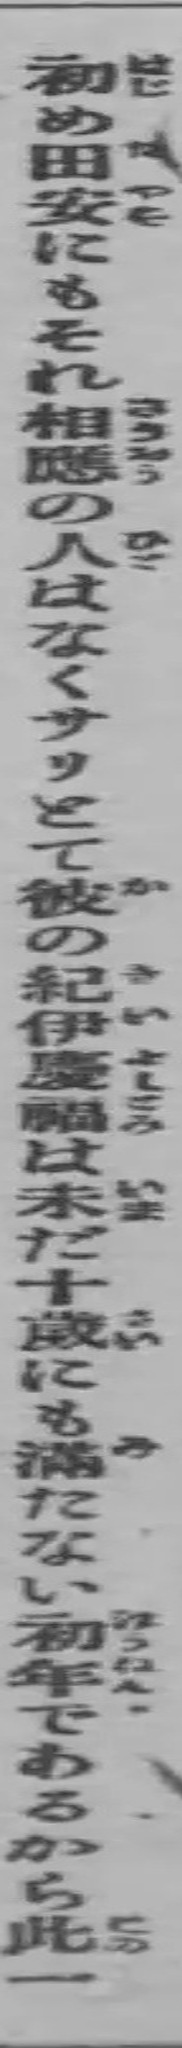初め田安にもそれ相応の人はなくサリとて彼の紀伊慶福は未だ十歳にも満たない初年であるから此一
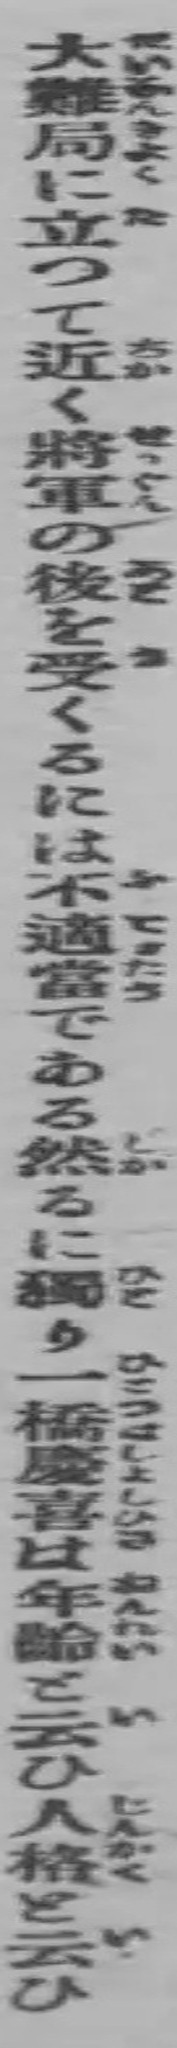大難局に立つて近く将軍の後を受くるには不適当である然るに独り一橋慶喜は年齢と云ひ人格と云ひ
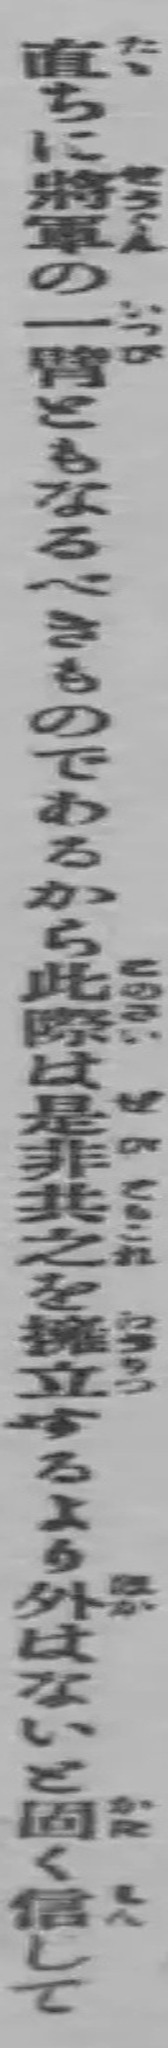直ちに将軍の一臂ともなるべきものであるから此際は是非共之を擁立するより外はないと固く信じて
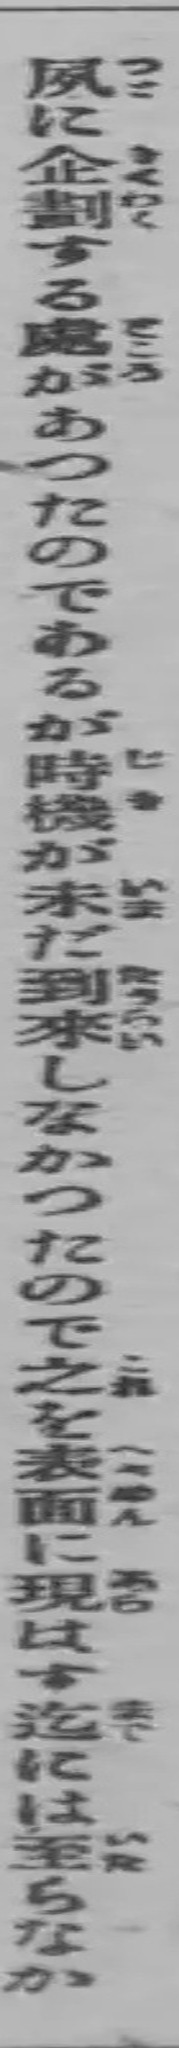夙に企劃する処があつたのであるが時機が未だ到来しなかつたので之を表面に現はす迄には至らなか
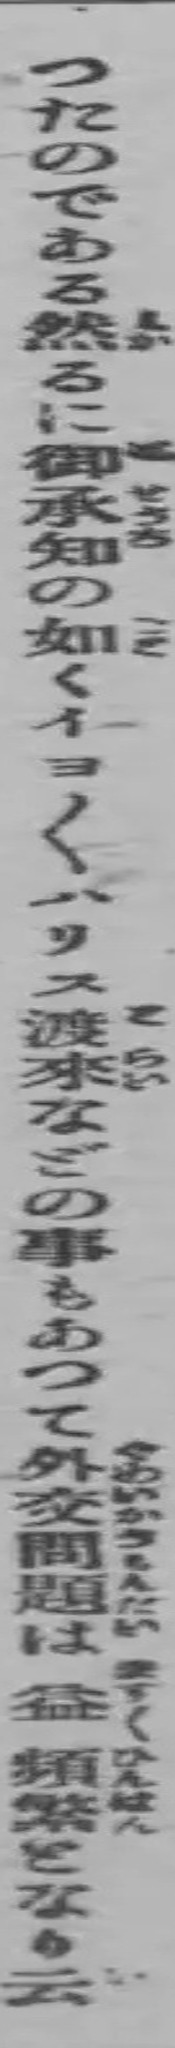つたのである然るに御承知の如くイヨ〳〵ハリス渡来などの事もあつて外交問題は益頻繁となり云
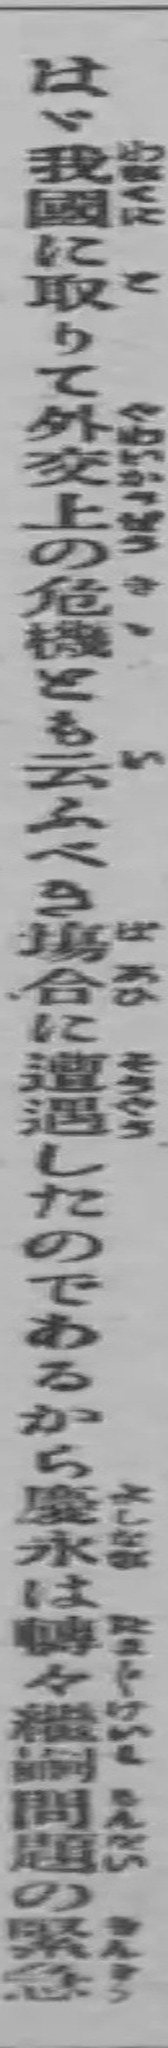はゞ我国に取りて外交上の危機とも云ふべき場合に遭遇したのであるから慶永は転々継嗣問題の緊急
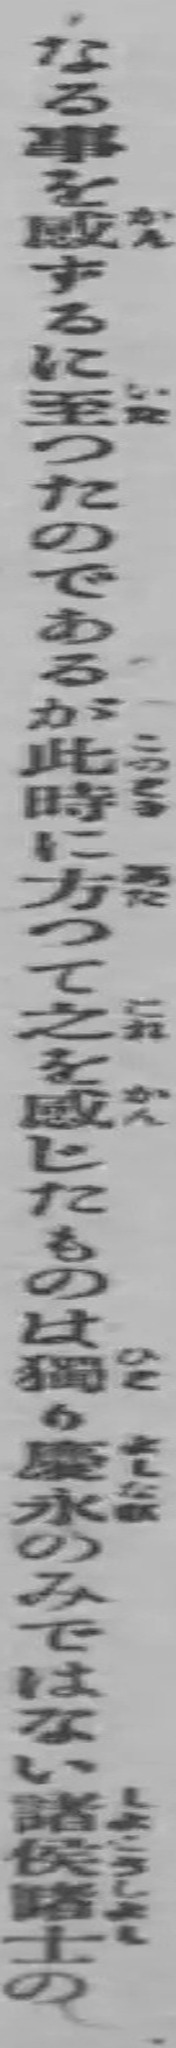なる事を感ずるに至つたのであるが此時に方つて之を感じたものは独り慶永のみではない諸侯諸士の
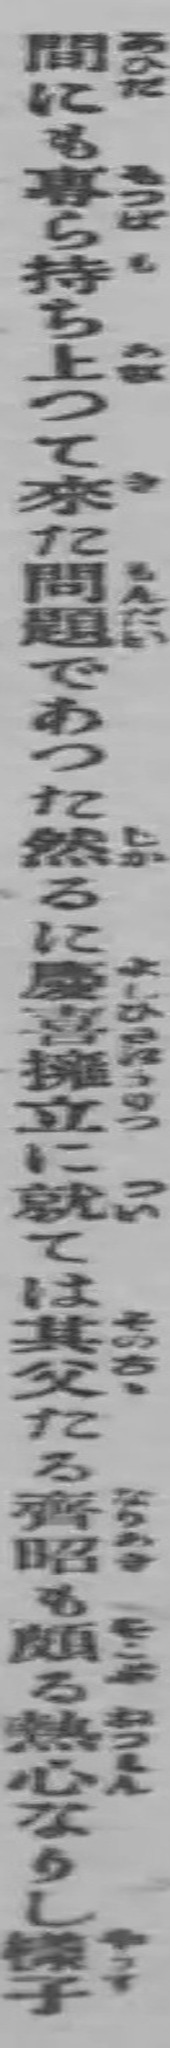間にも専ら持ち上つて来た問題であつた然るに慶喜擁立に就ては其父たる斉昭も頗る熱心なりし様子
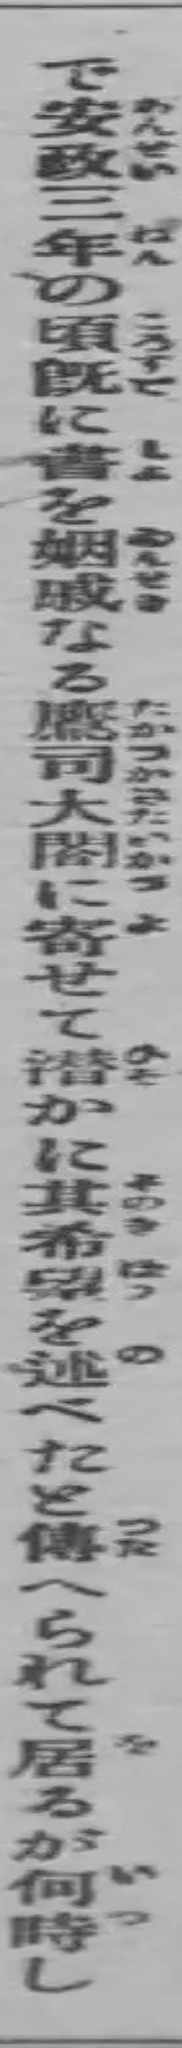で安政三年の頃既に書を姻戚なる鷹司太閤に寄せて潜かに其希望を述べたと伝へられて居るが何時し
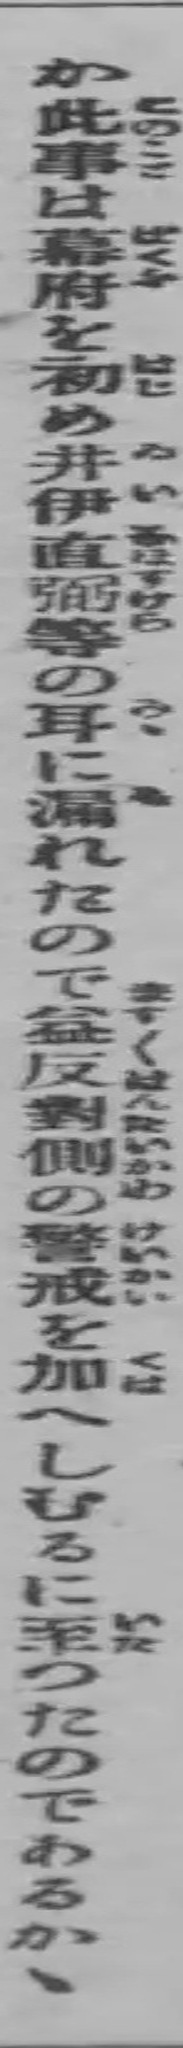か此事は幕府を初め井伊直弼等の耳に漏れたので益反対側の警戒を加へしむるに至つたのであるかゝ
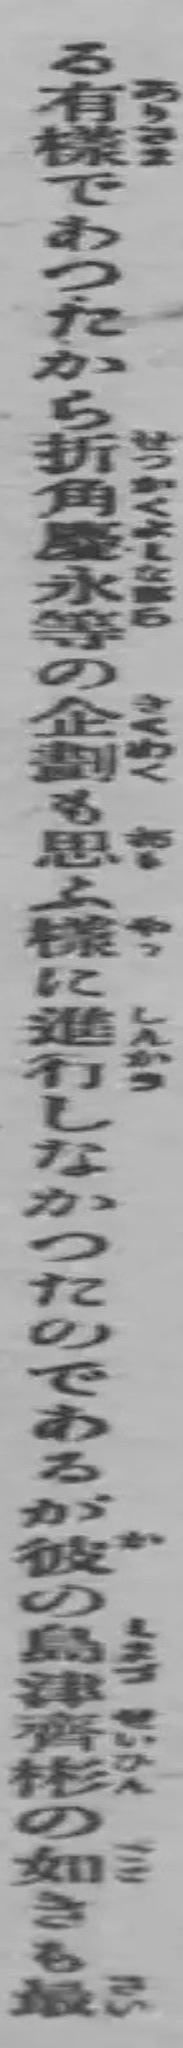る有様であつたから折角慶永等の企劃も思ふ様に進行しなかつたのであるが彼の島津斉彬の如きも最
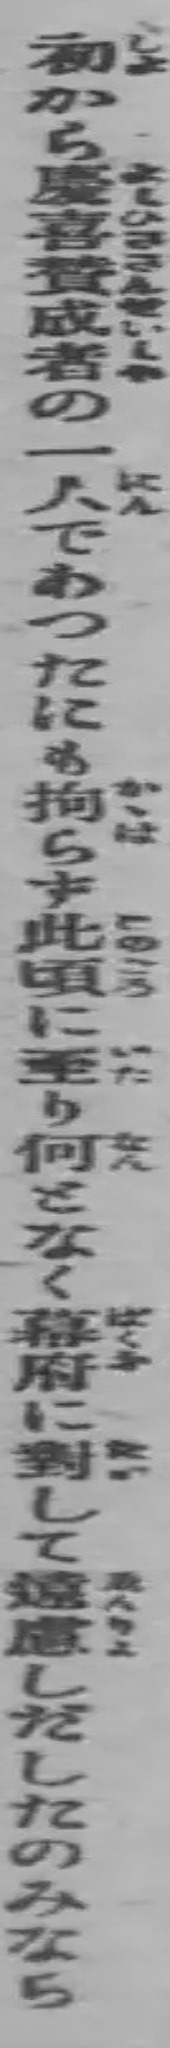初から慶喜賛成者の一人であつたにも拘らず此頃に至り何となく幕府に対して遠慮しだしたのみなら
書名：豊橋市史談
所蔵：国立国会図書館 National Diet Library, JAPAN
